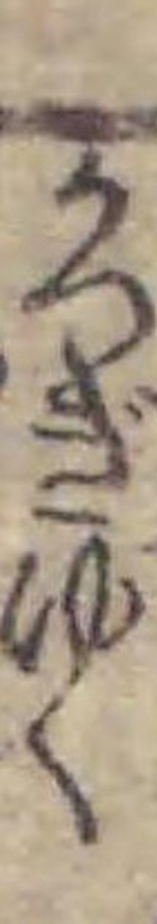かつぎゆく
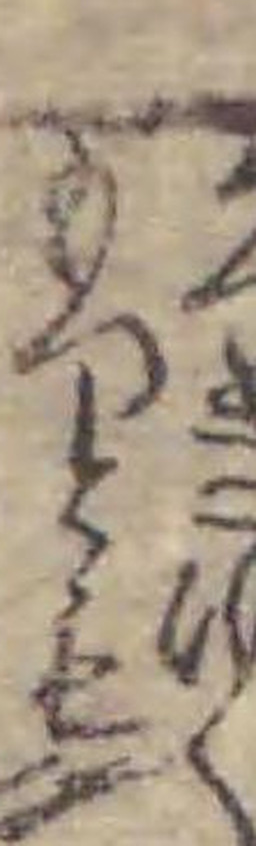もつとも
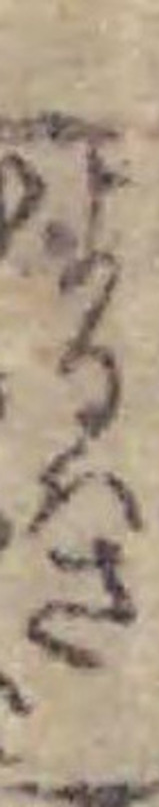よるはさ
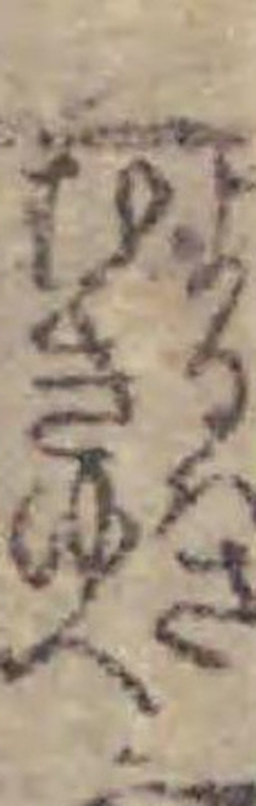むきゆへ
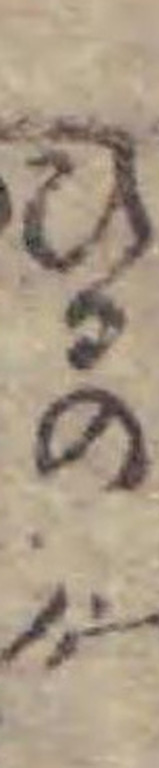ひるの
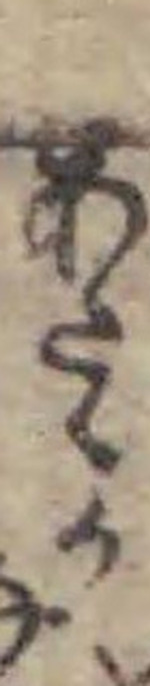あたゝかな
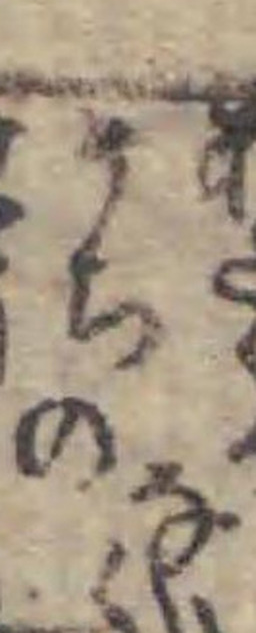うちの
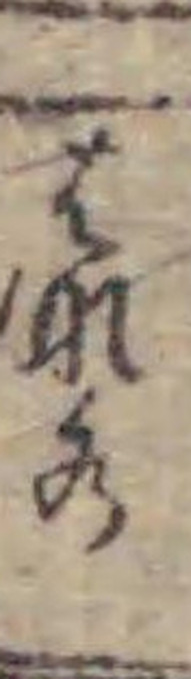はな水
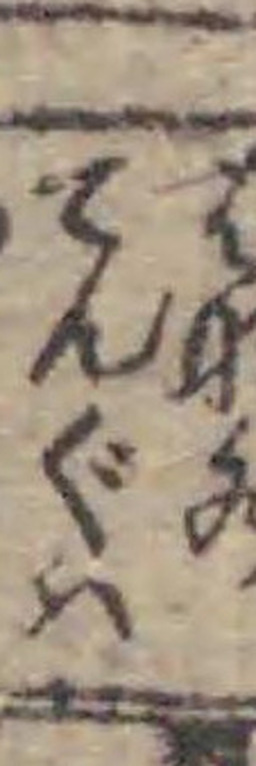てんぐは
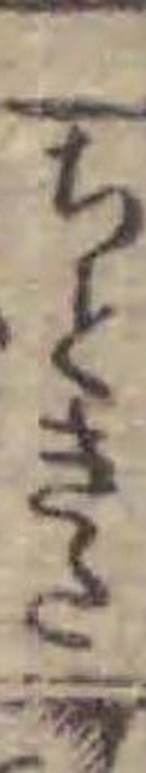ちときた
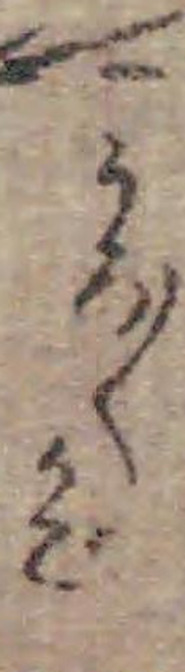うろ〳〵かご
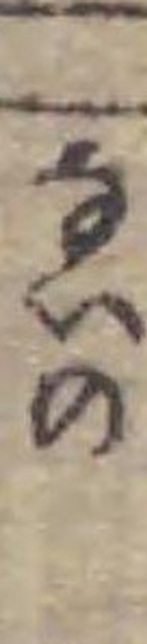ないの
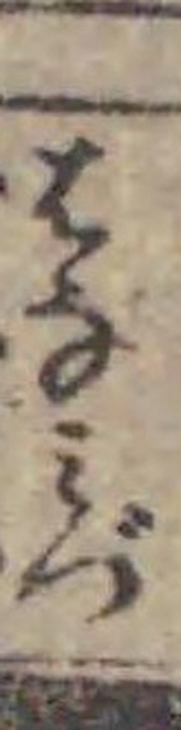はなみづ
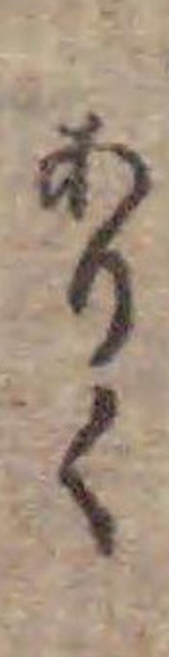ありく
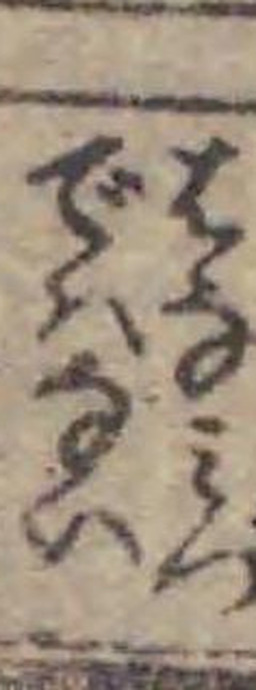ではない
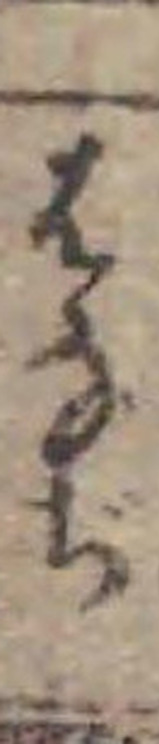はなぢ
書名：本樹真猿浮気噺 : 3巻
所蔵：国立国会図書館 National Diet Library, JAPAN
